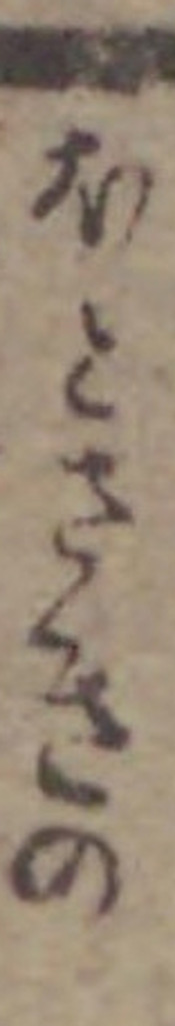ほとさきの
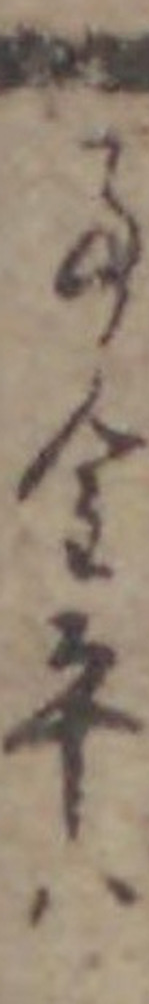事金平は
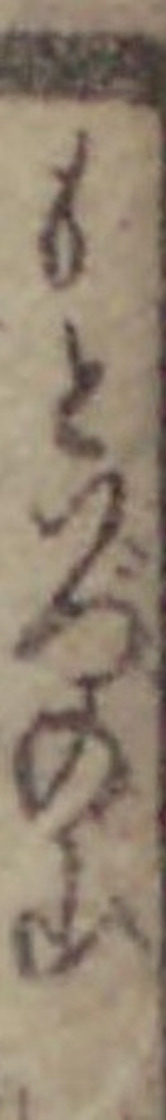もといづの山
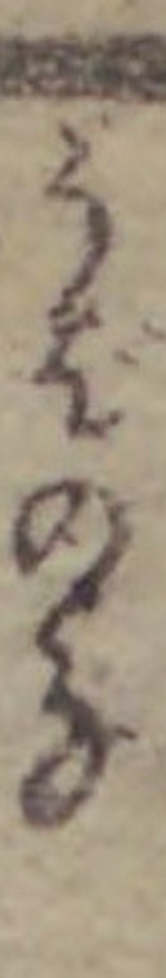うばの子
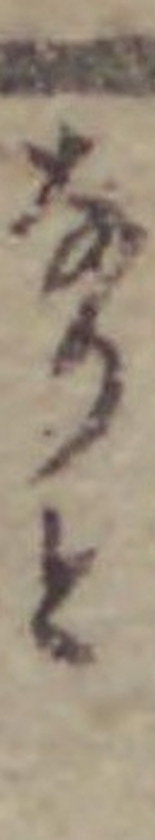なりと
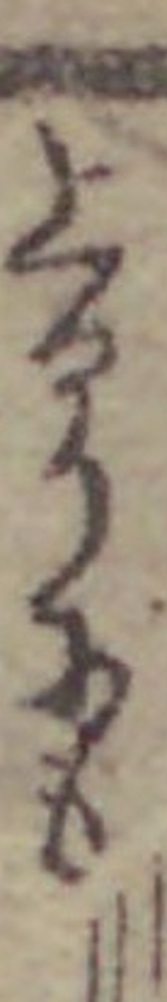上るりにも
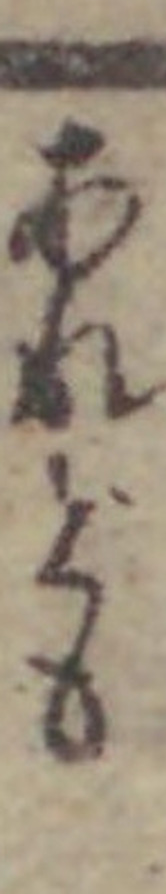あれども
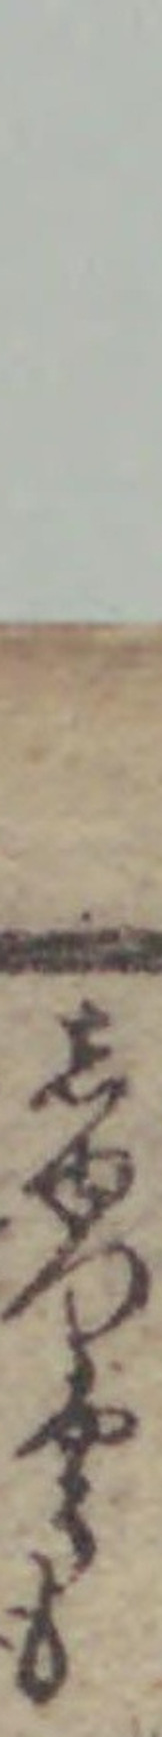しゆつしやうも
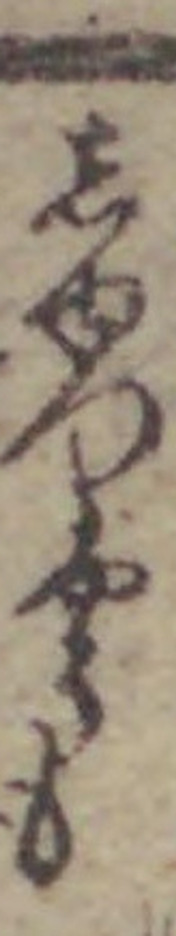しゆつしやうも
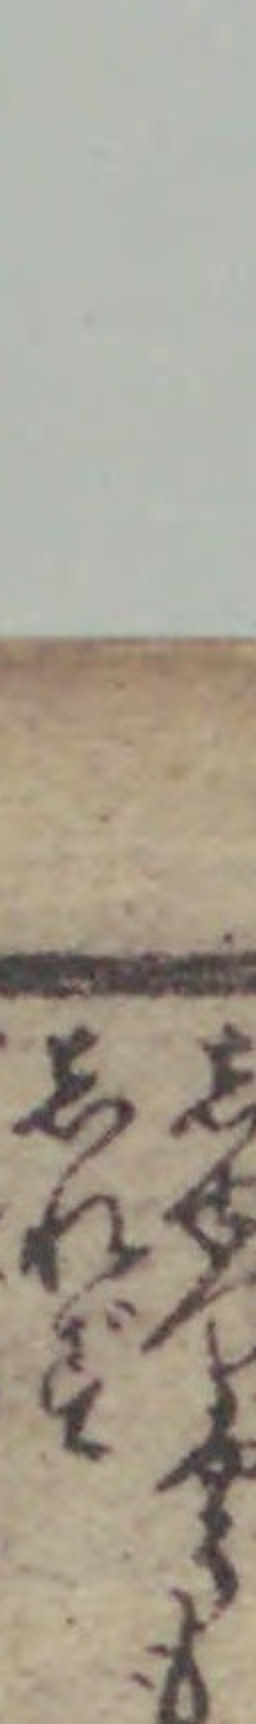しれず
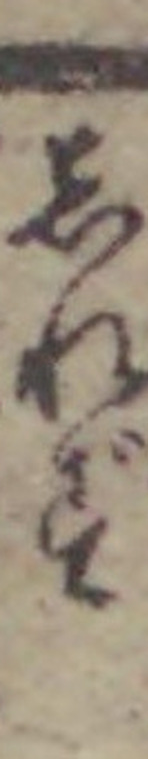しれず
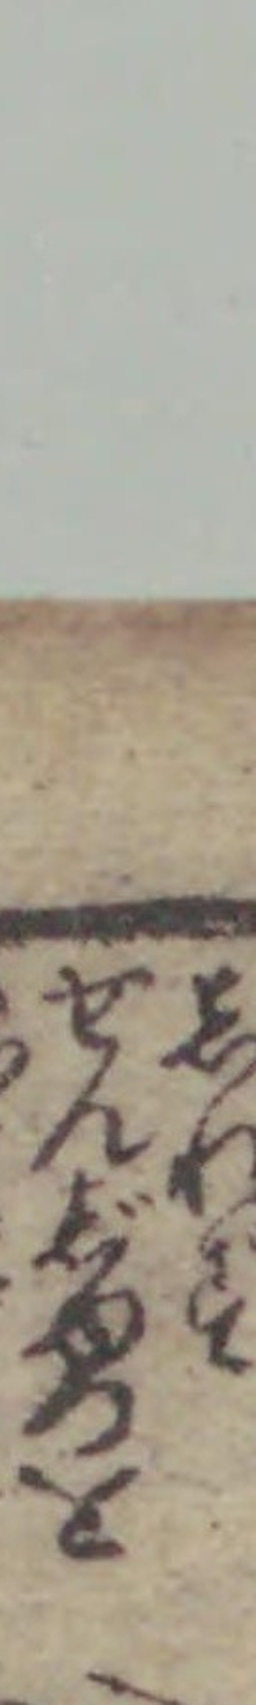せんじゆつを
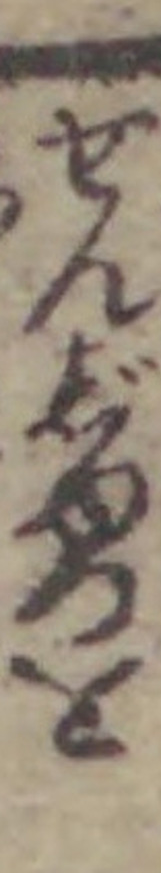せんじゆつを
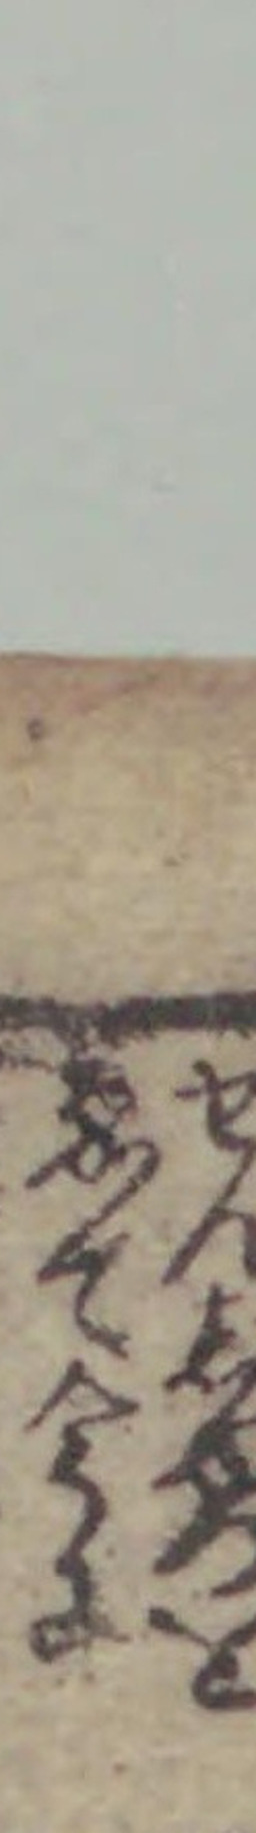ゑて今に
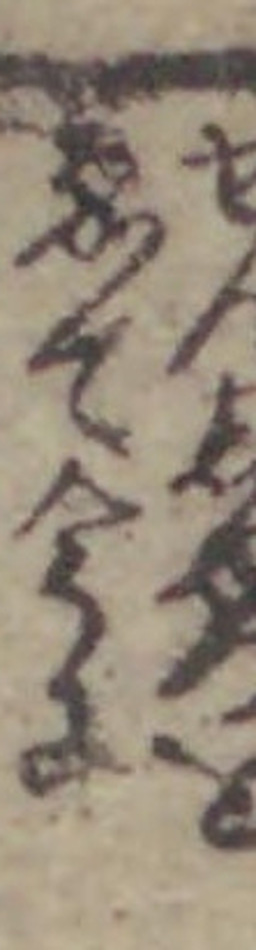ゑて今に
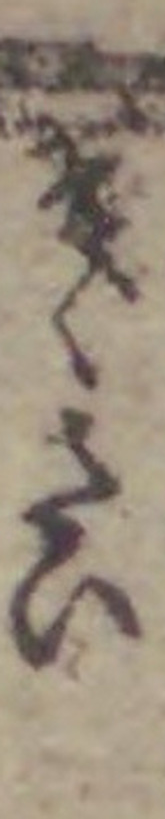そくさい
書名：化物鼻がひしげ 2巻
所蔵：国立国会図書館 National Diet Library, JAPAN
